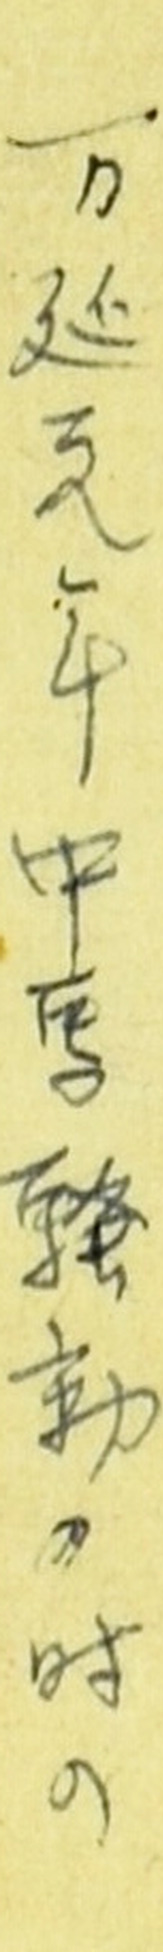万延元年中馬騒動の時の
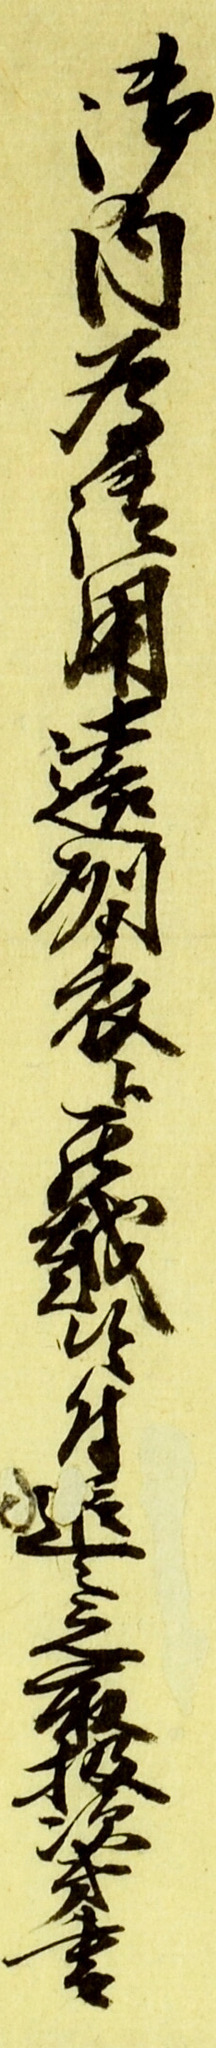御内為御用遠州表江罷越候ニ付追々之取扱次第書
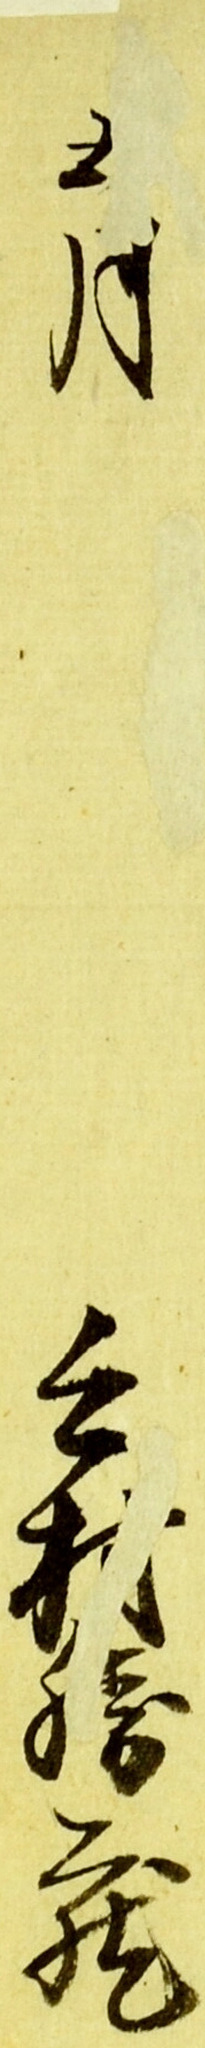五月今村勝蔵
